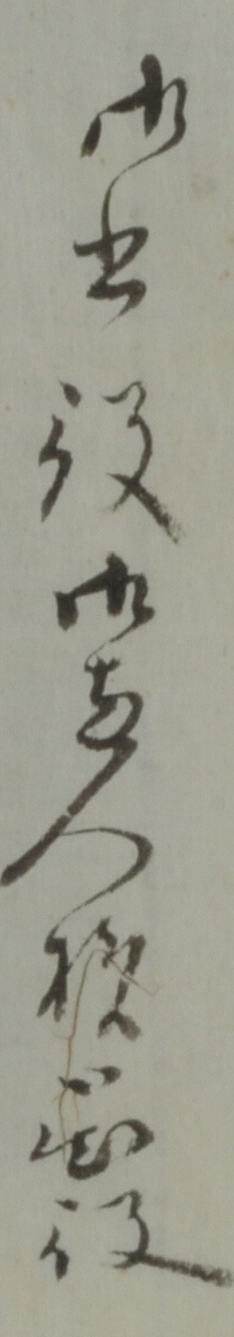御書役御両人様御出役
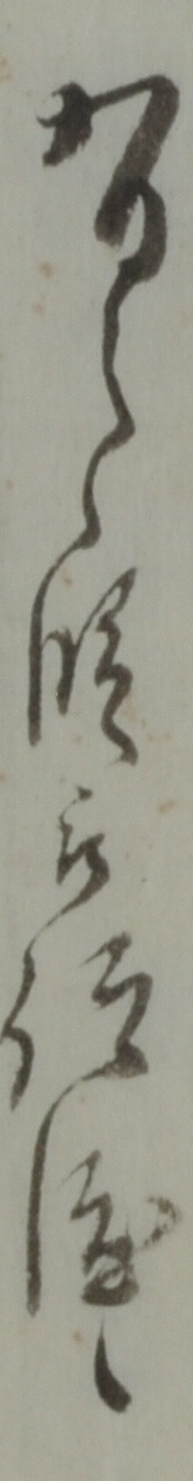有之候段被仰渡候
